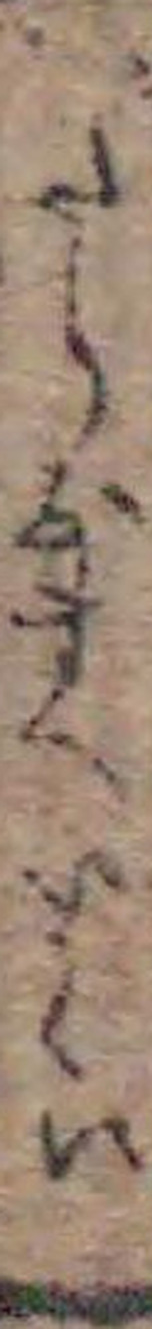たらおまへにくい
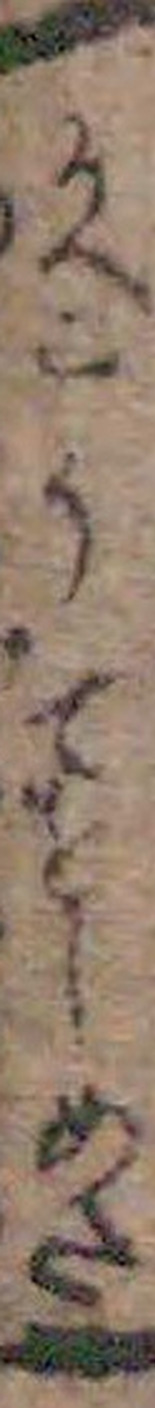かへこうてをしめた
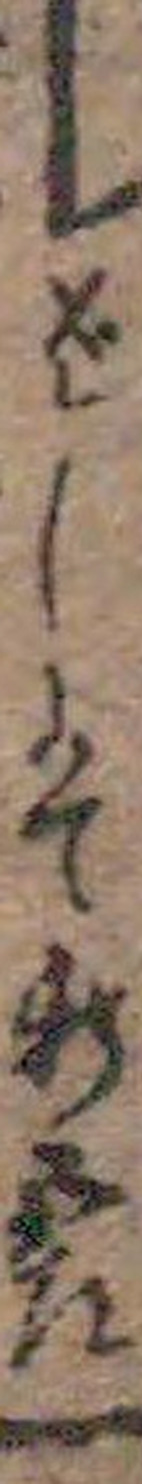ばしにて新五左
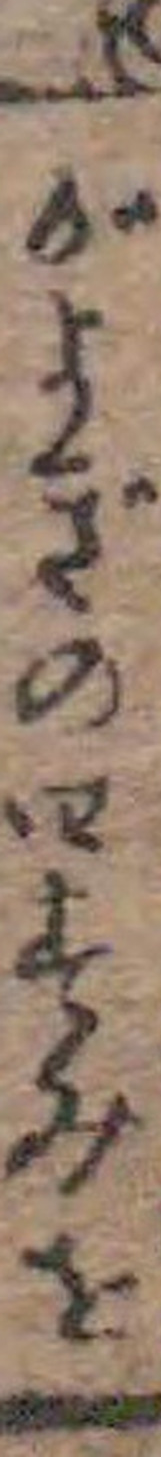がよぎの四すみを
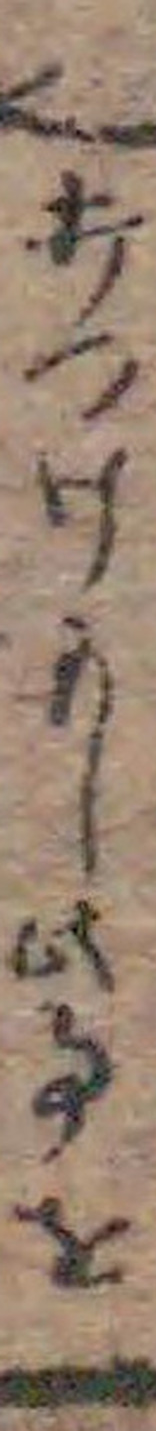打つけもし此事を
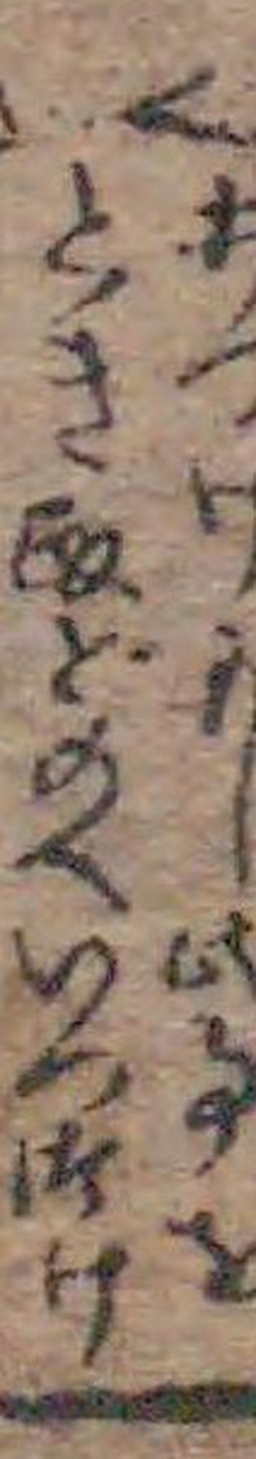とき政どのへいつつけ
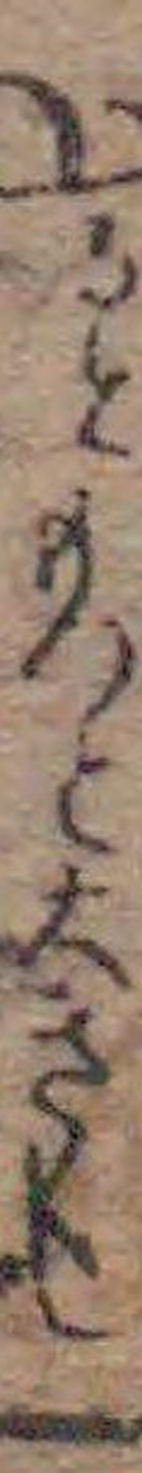るともつと大きくし
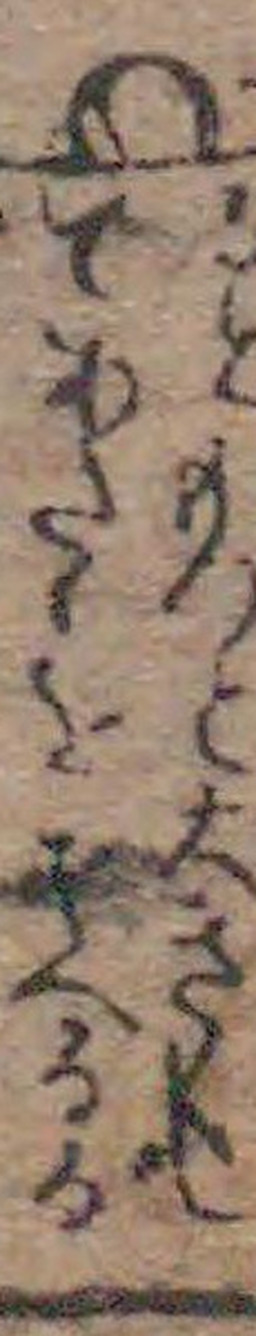てあたゝをすへるが
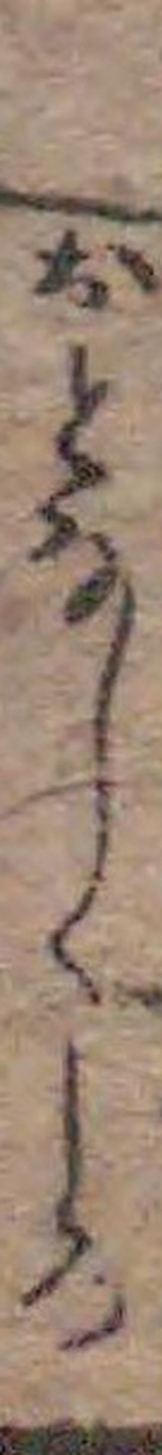おとなしくしろ
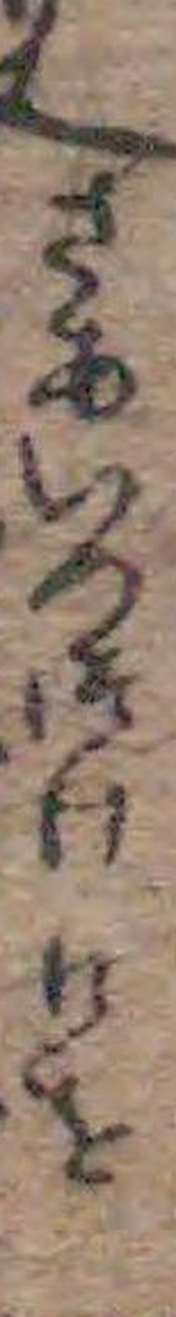さあいつつけ口を
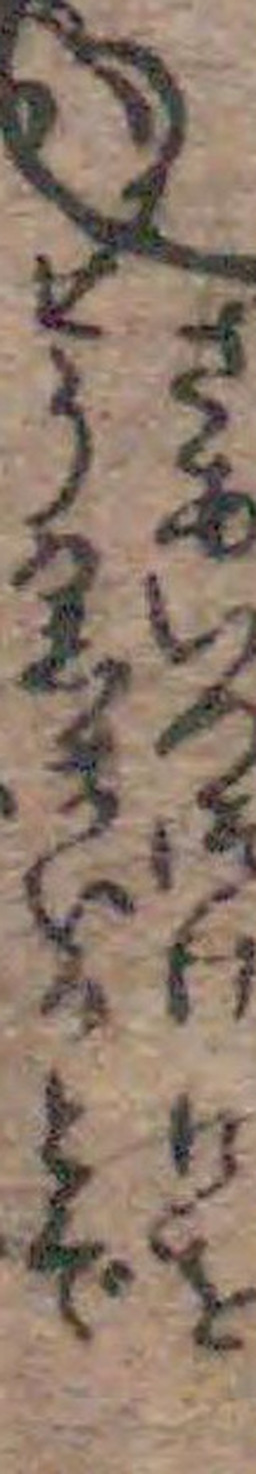せうかしまいかとぞ
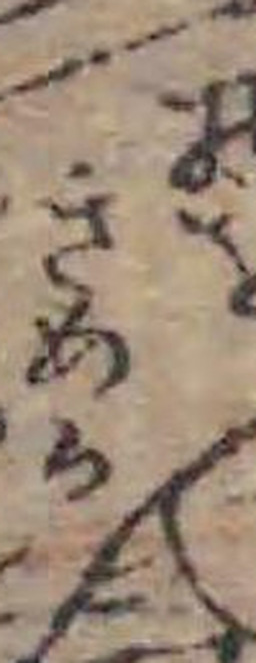きめる
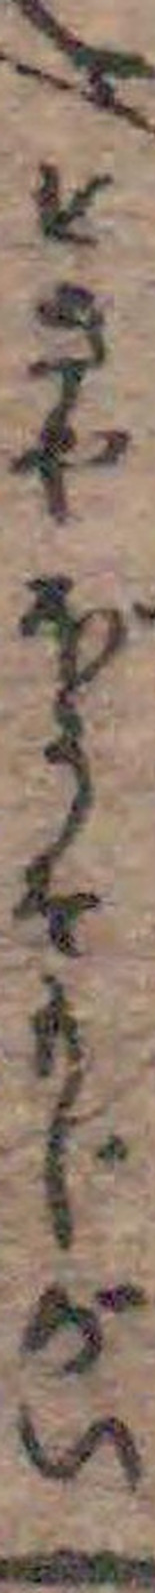せきやぼうそもじがい
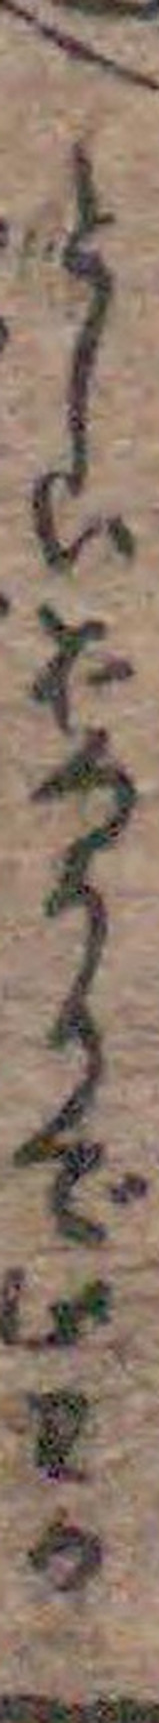としいばかりで此わか
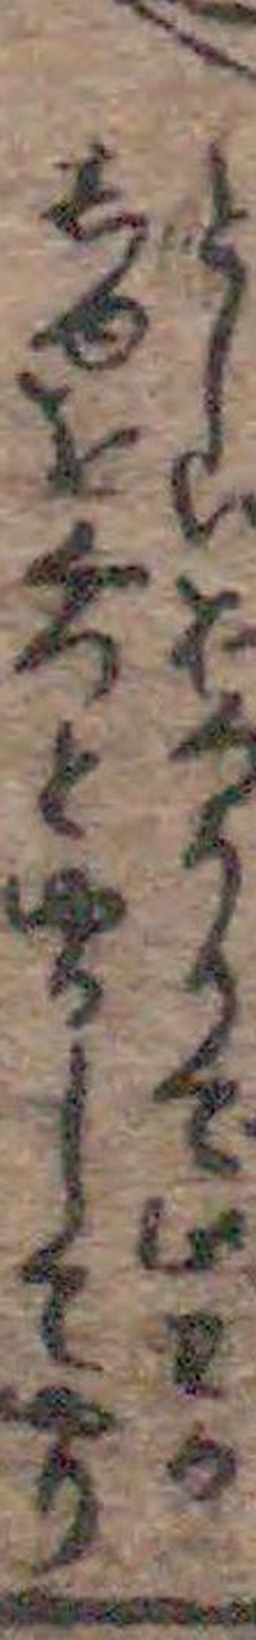しゆをぐつとゆるしてやり
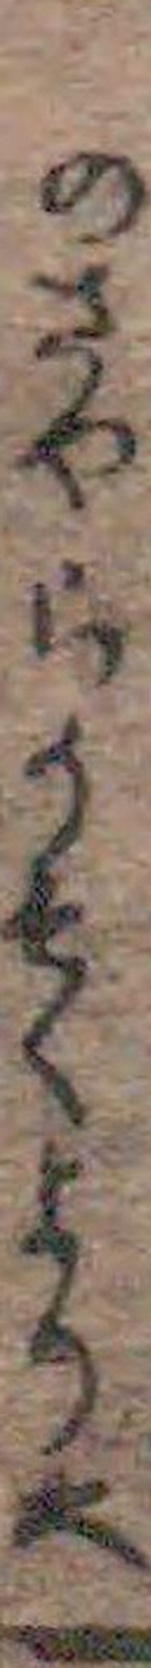のさやらうそくより大
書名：三舛増鱗組 : 3巻
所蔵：国立国会図書館 National Diet Library, JAPAN
